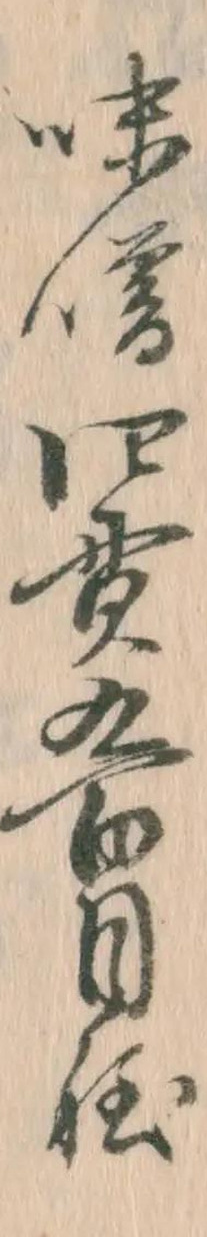味噌四貫九百目程

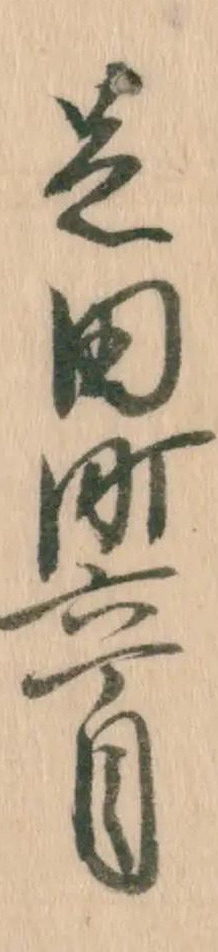芝田町六丁目
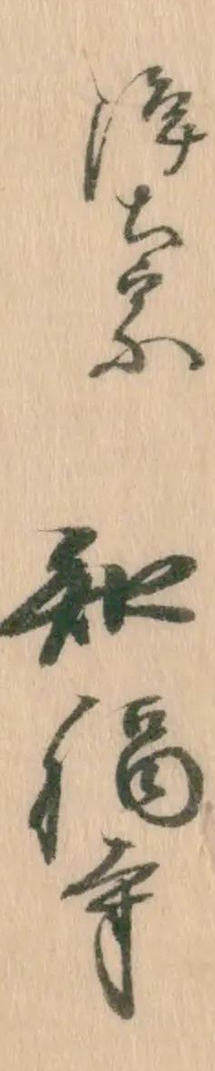浄土宗知福寺
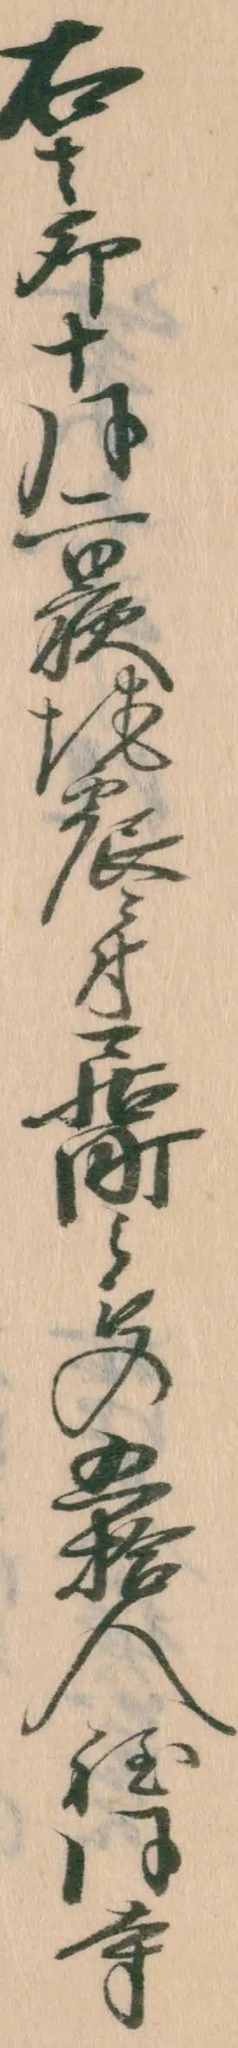右は卯十月二日夜地震ニ付居町之もの五拾八人程同寺
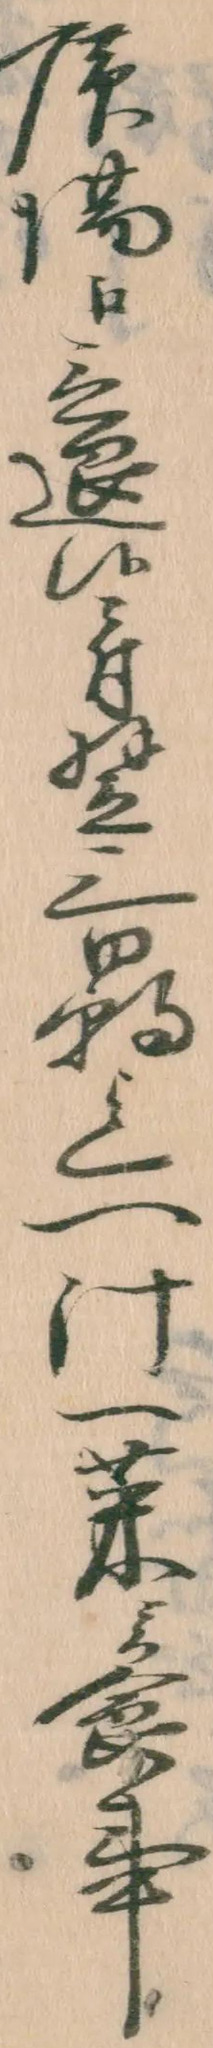広場え立退候ニ付翌三日朝迄一汁一菜ニ而食事
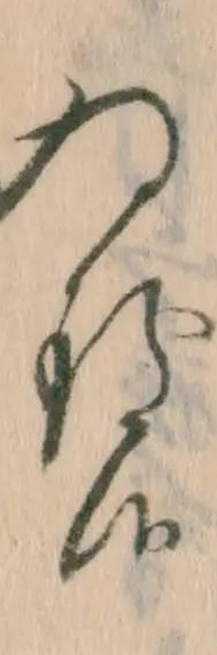為致候
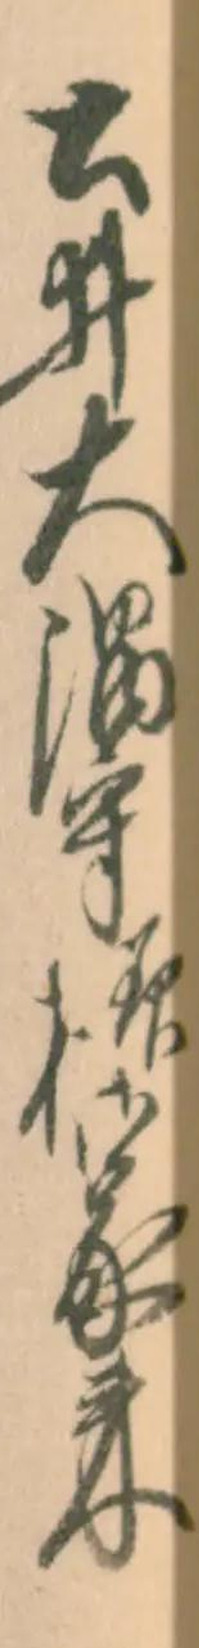土井大隅守様御家来
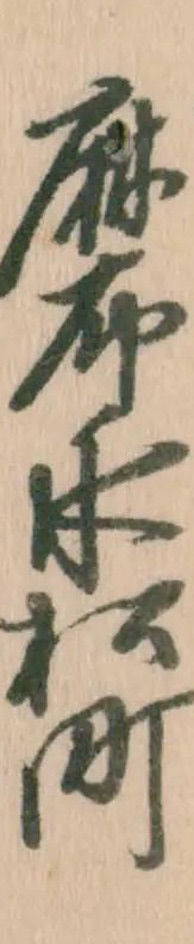麻布永松町
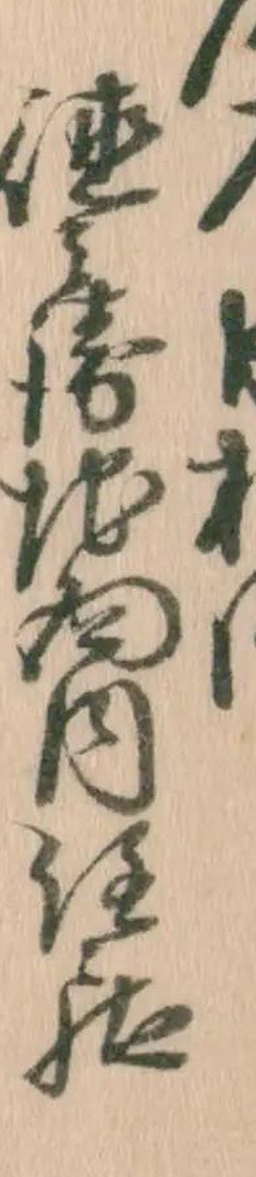徳兵衛地面内住居
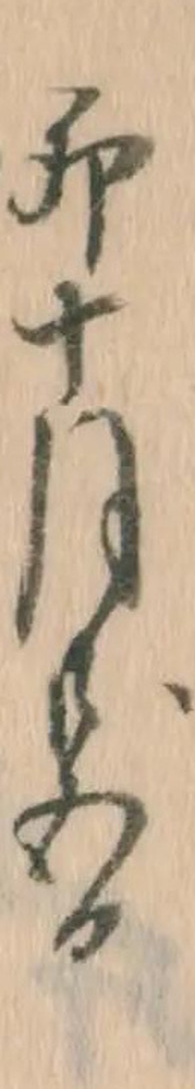卯十月廿五日右
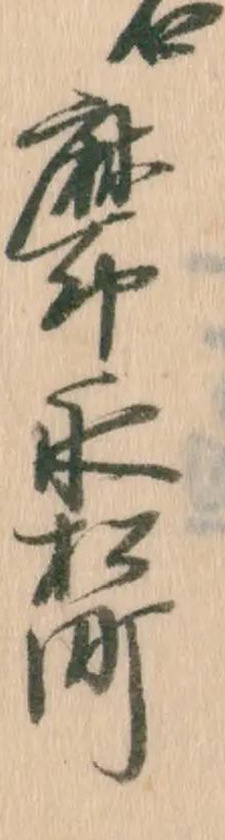麻布永松町

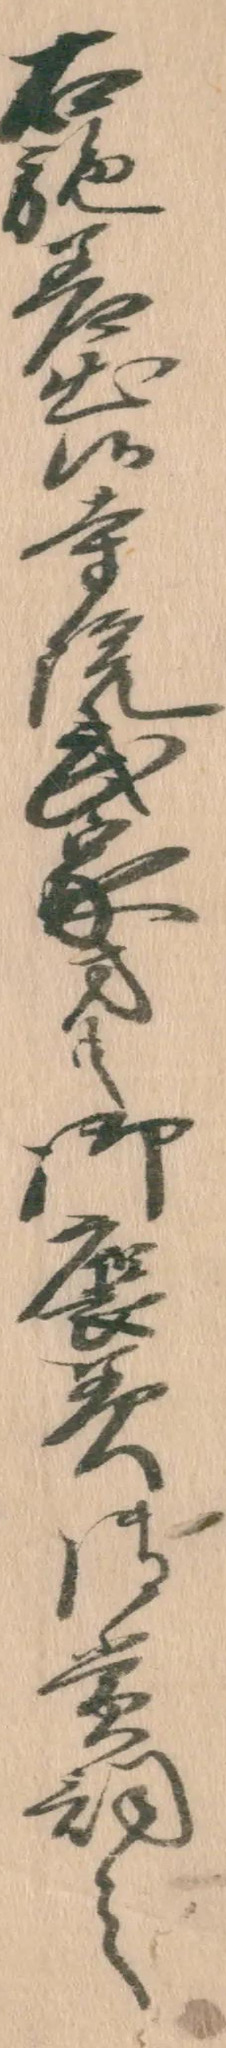右施差出候寺院武家方之御褒美御賞詞之
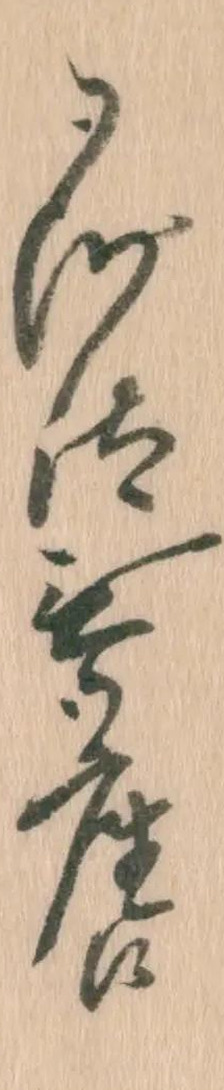御沙汰無御座候
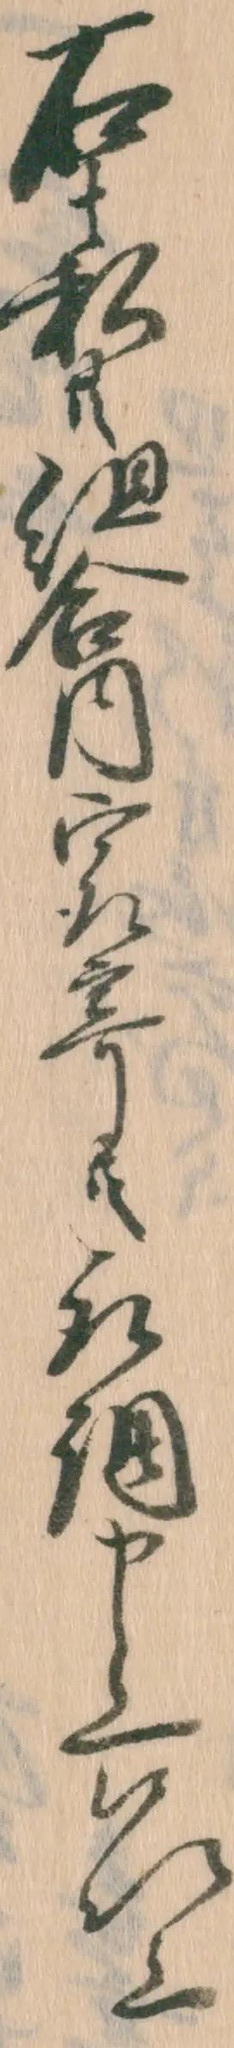右は私共組合内最寄共取調申上候以上
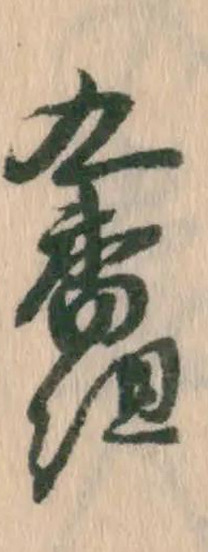九番組
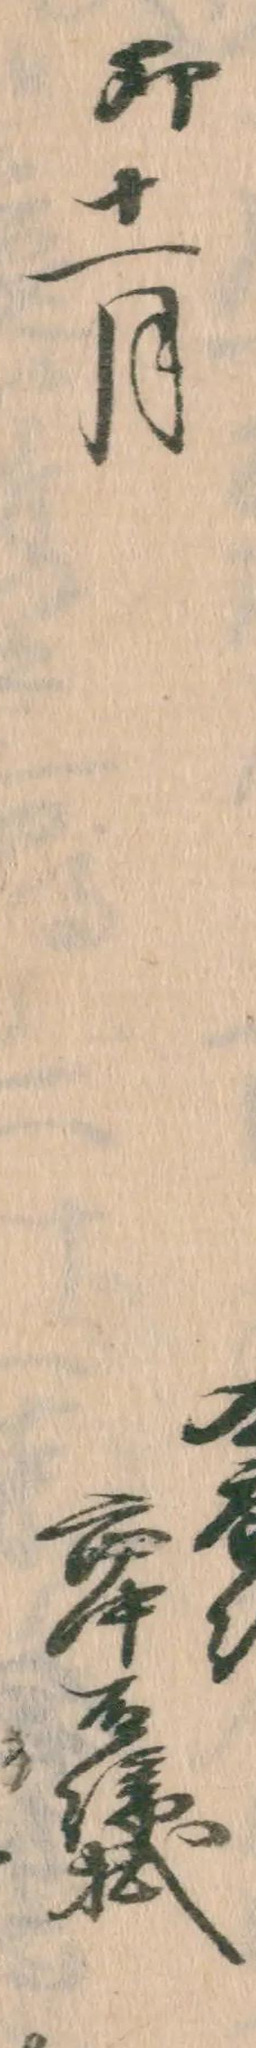卯十一月市中取締掛
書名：武家方并寺院等ニテ施差出候一件
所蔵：国立国会図書館 National Diet Library, JAPAN
